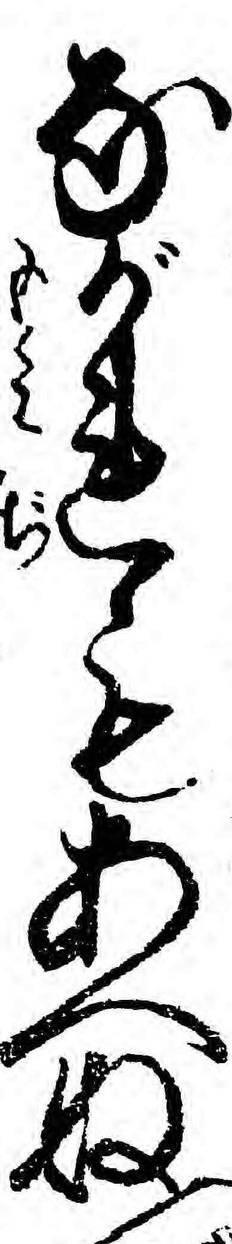ながれもあへぬ
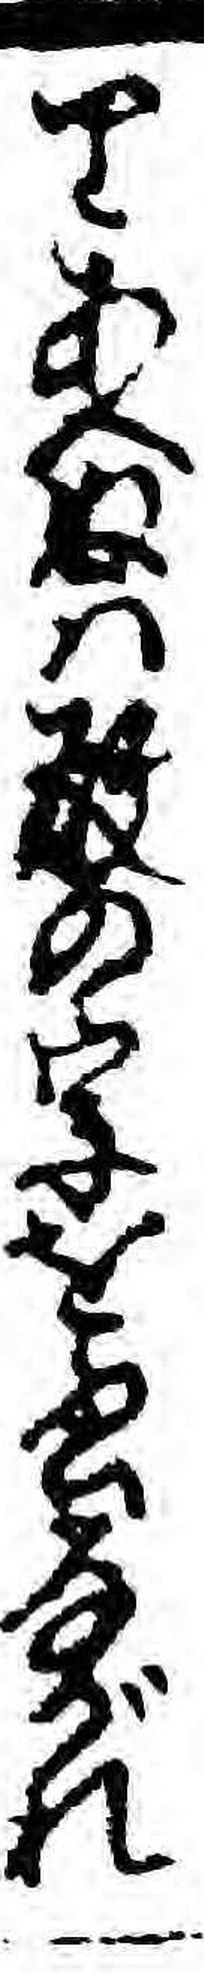りあへぬは敢の字を書ながれ
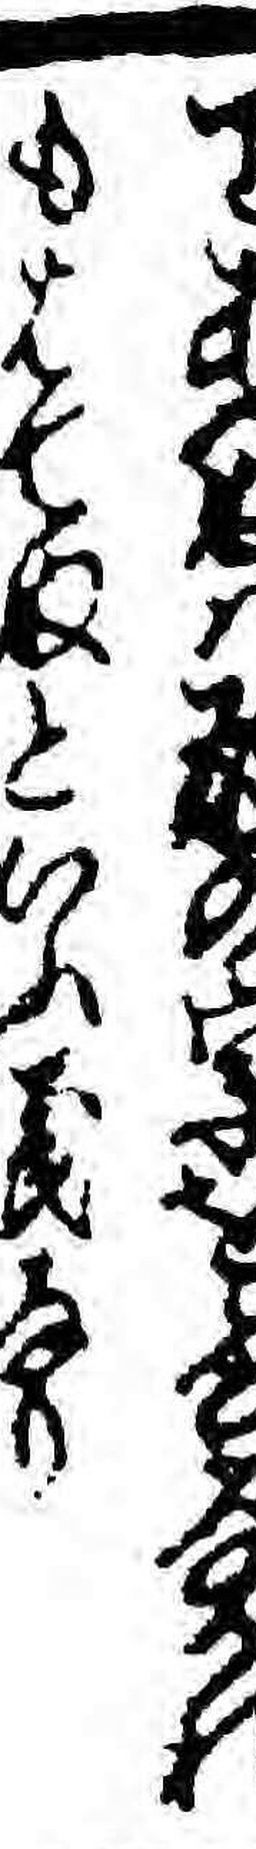もはてぬといふ義なり
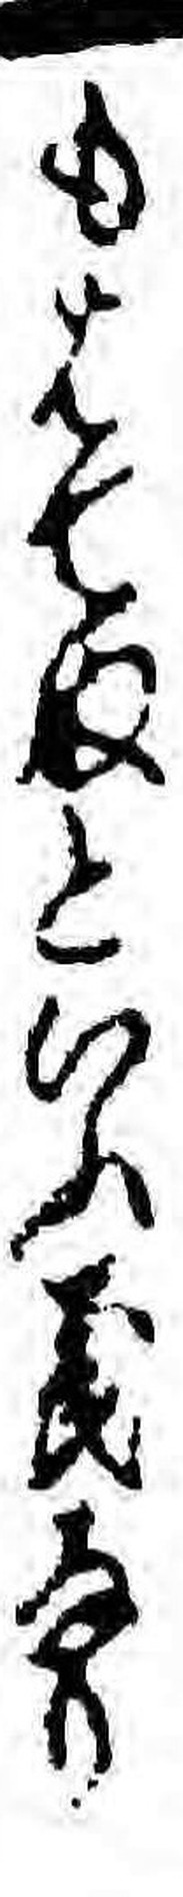もはてぬといふ義なり
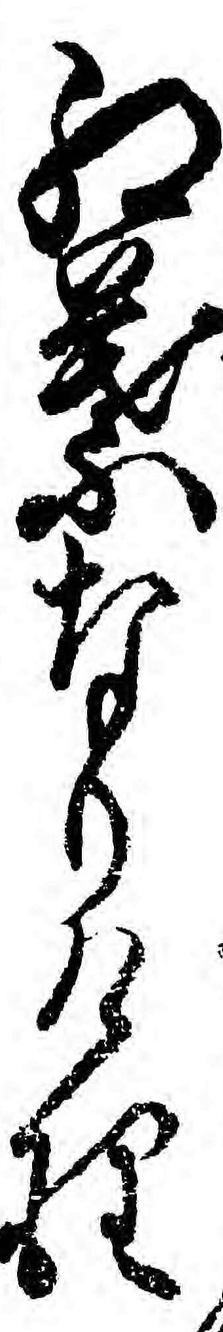紅葉なりけり
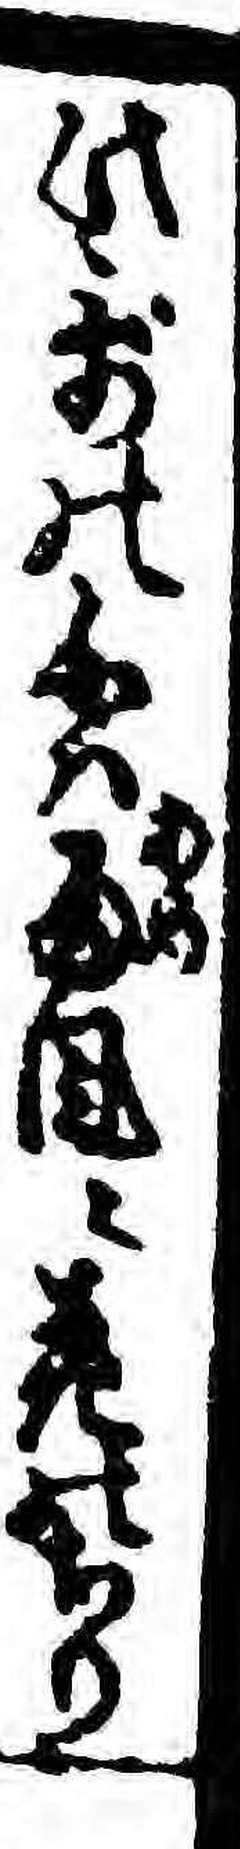此哥の心は雨風に花のちり
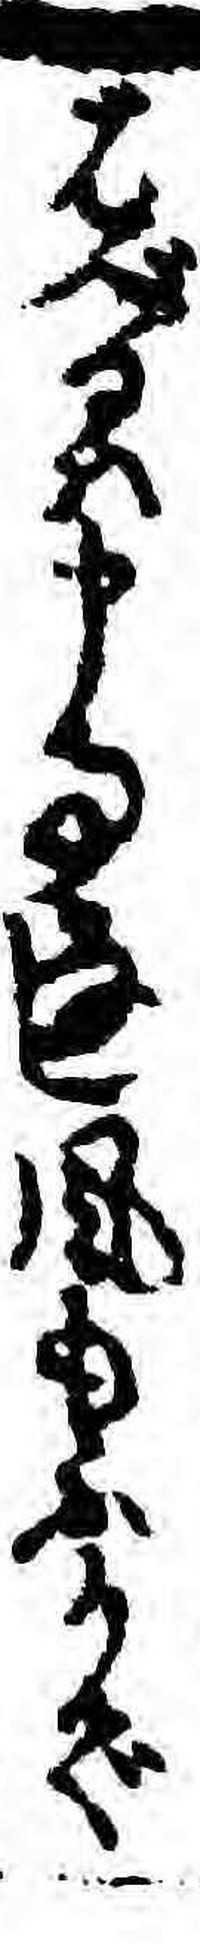はべるは申事なしかぜもふかで
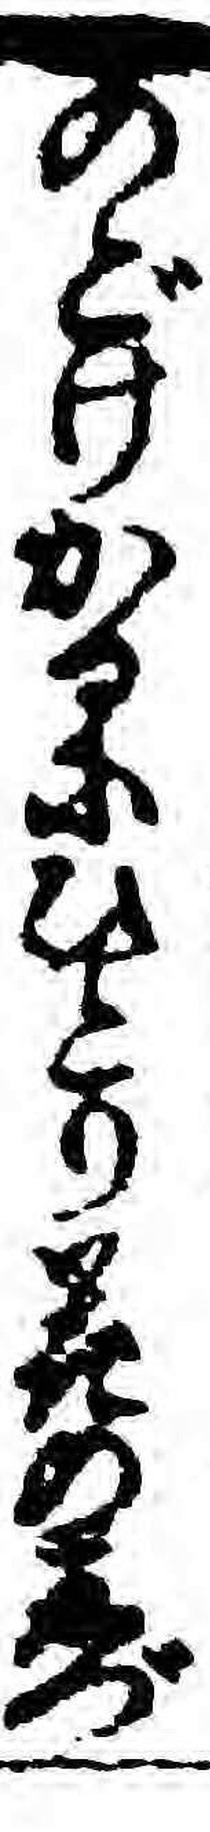のどけかるにひとり花のしづ
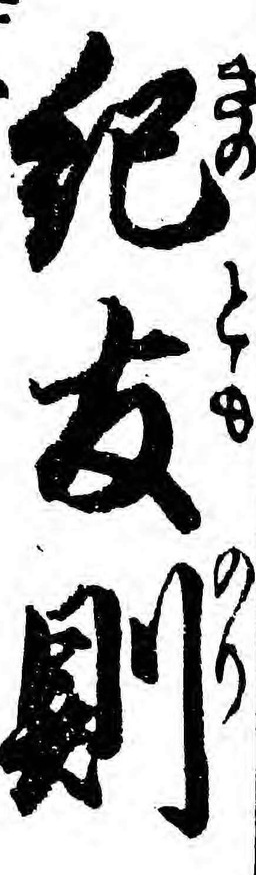紀友則
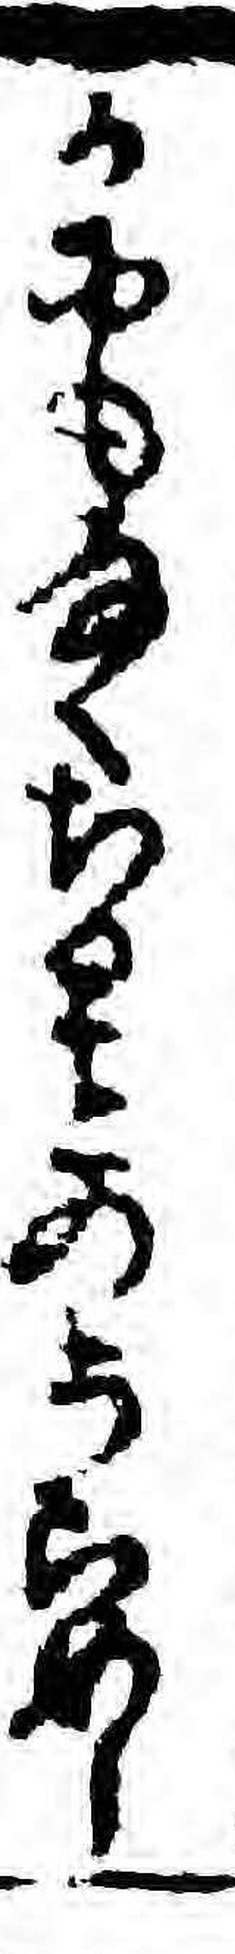かにもなくちることのうらめし
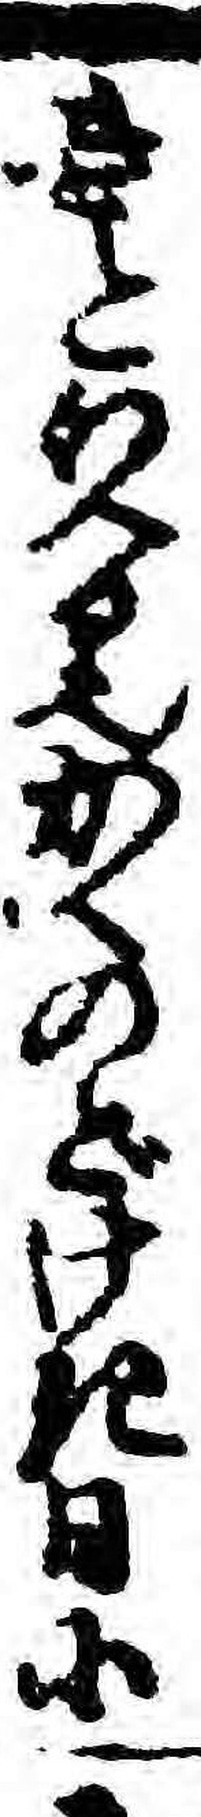きといへる也かくのどけき日に
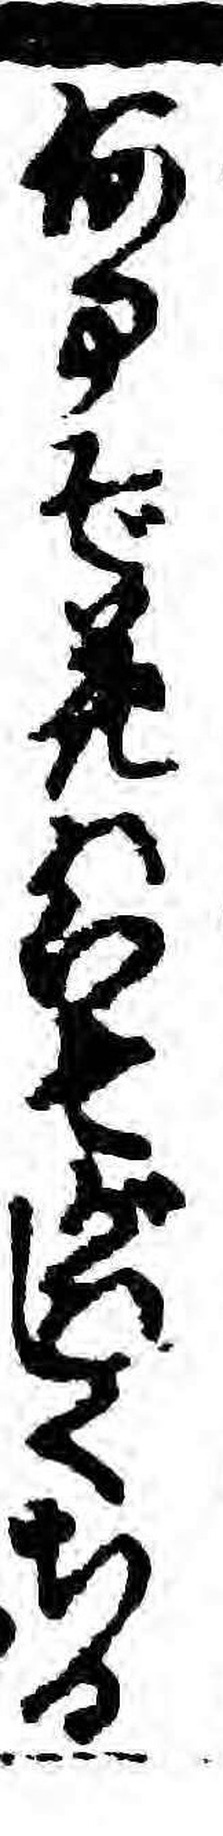何事ぞ花はいそがはしくちる
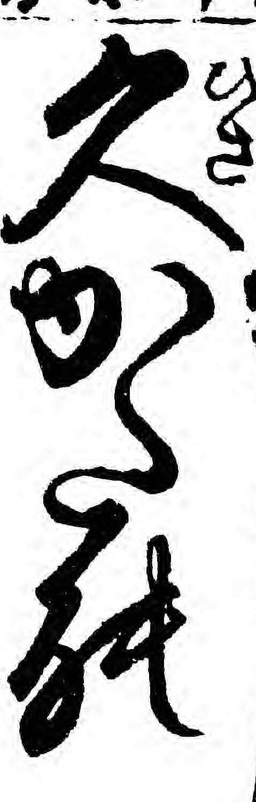久かたの
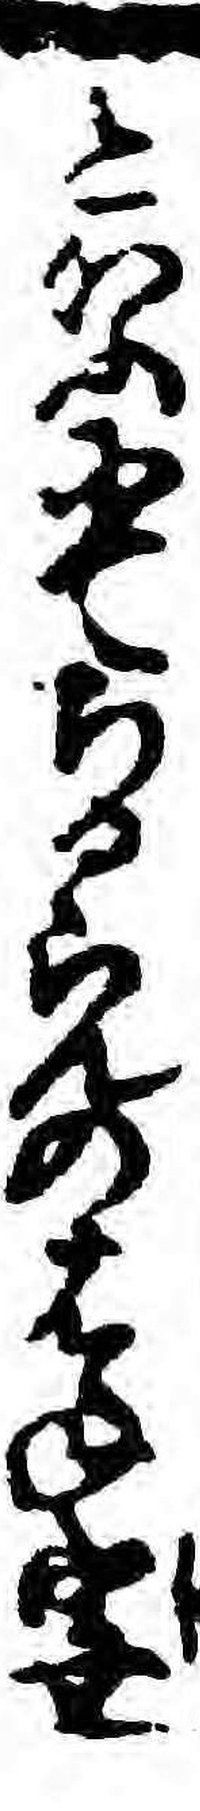といふにてちるらんのはね字
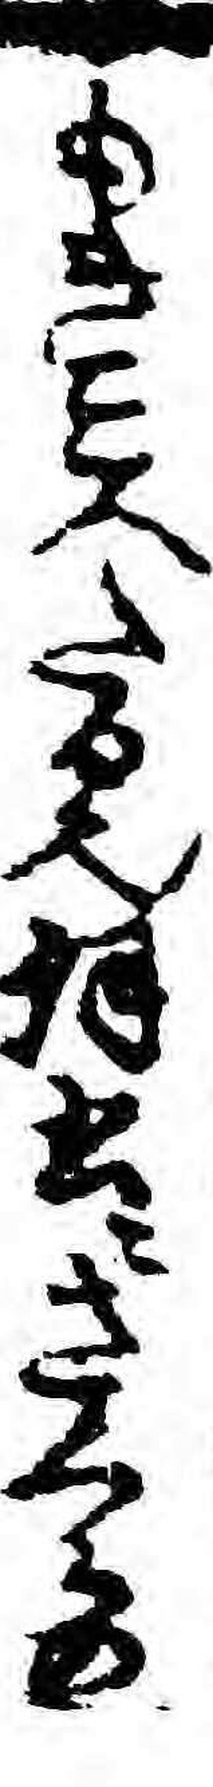もきこへたる也詞書にさくらの
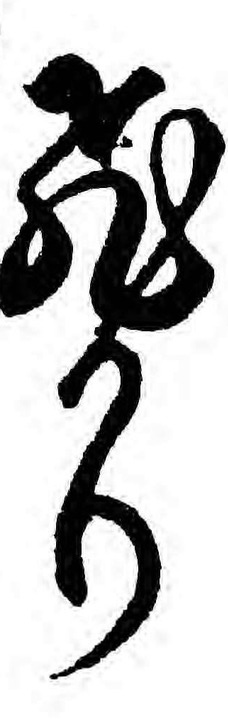ひかり
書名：頭書和歌注譯／壽賀多百人一首小倉錦
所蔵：国文学研究資料館
